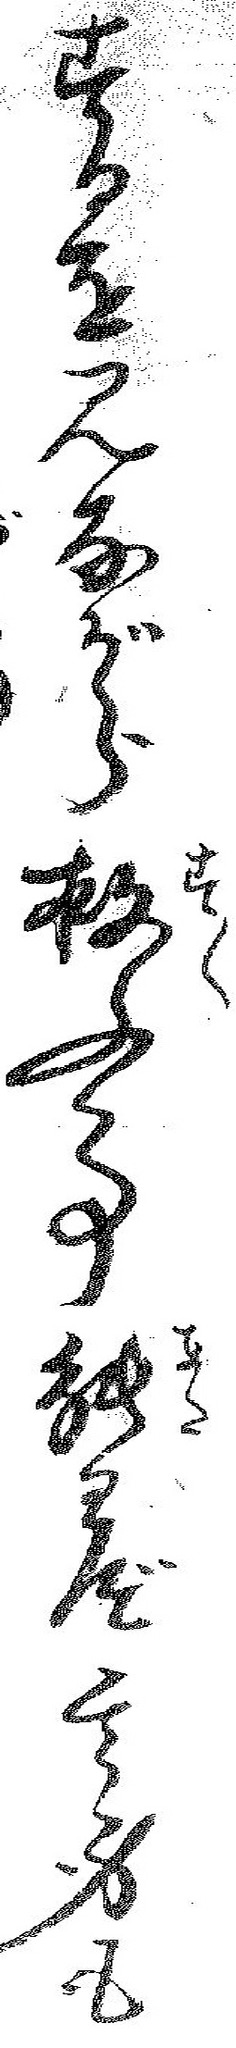するを見ながら救ふ事能わず其身も
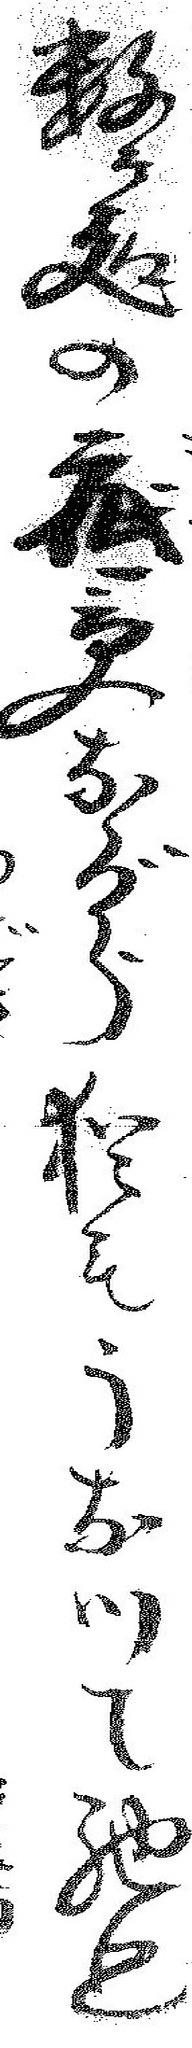数ヶ処の疵受ながら猶もうなつて馳廻
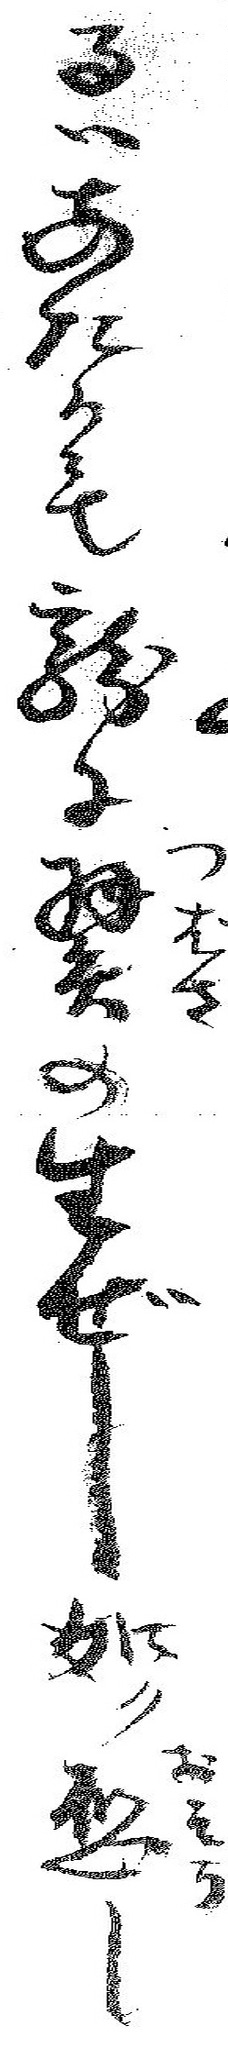るはあたかも龍に翼の生ぜし如く恐し
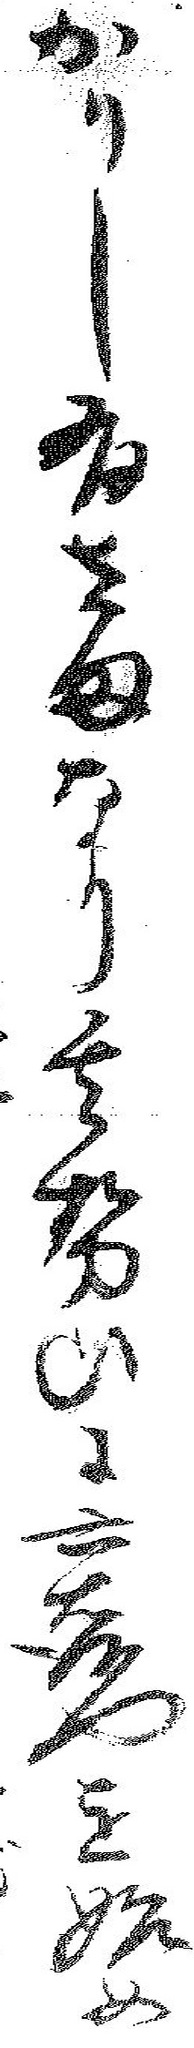かりし有さまなり其勢ひに六右衛門を始め
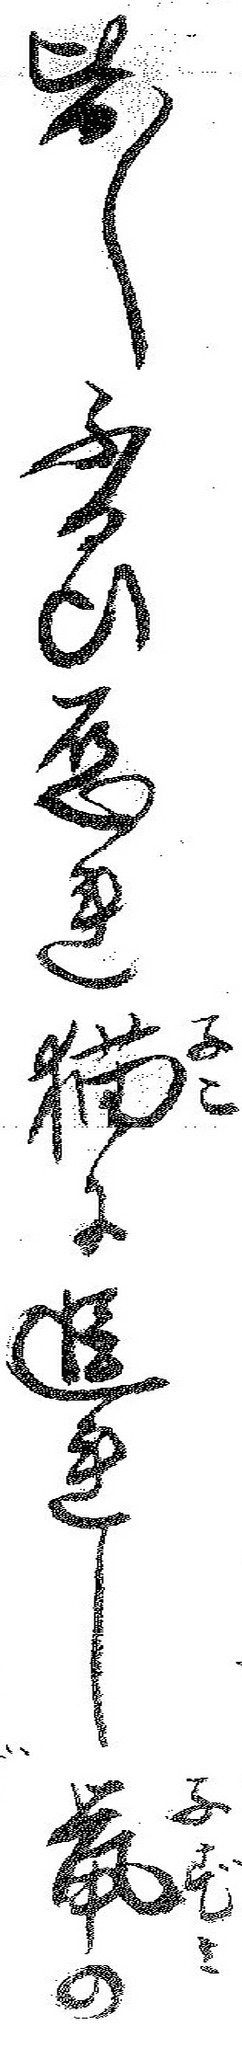皆〳〵ふるひ恐れ猫に追れし鼠の
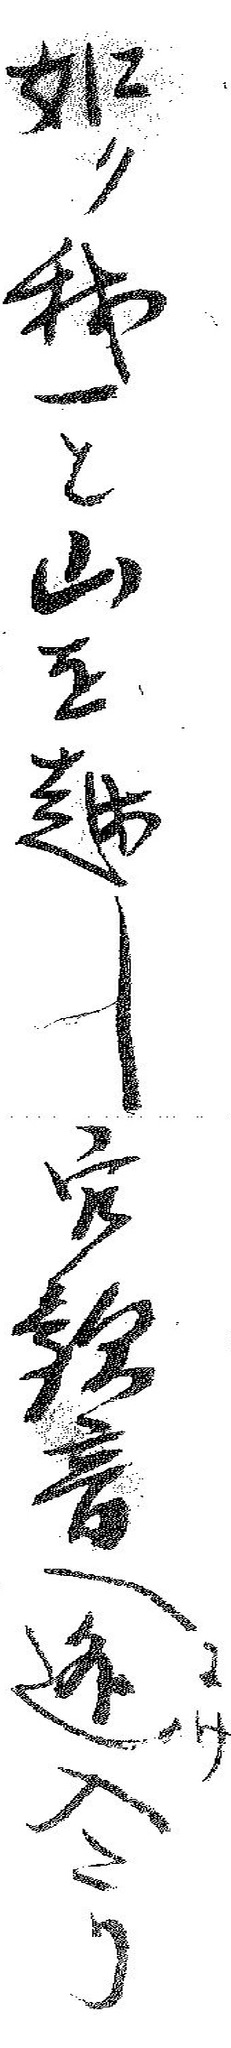如く我一と山を越し穴観音へ逃入たり
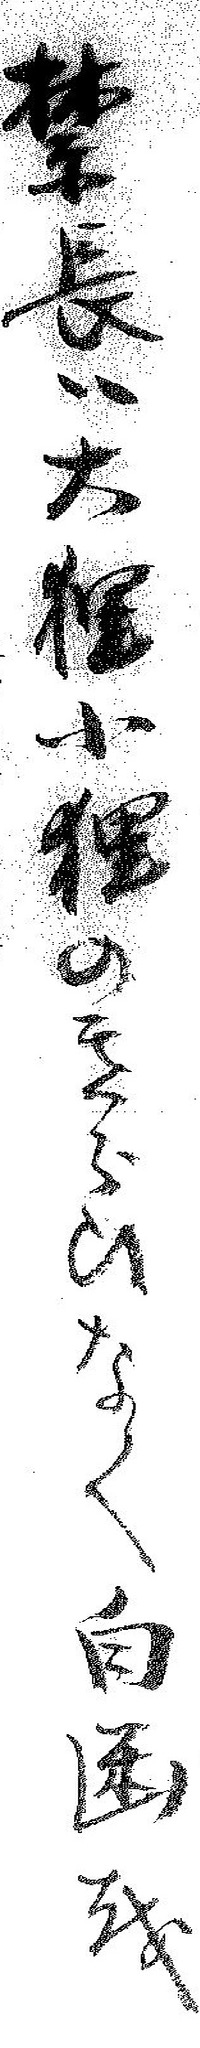禁長は大狸小狸のきらひなく白歯を
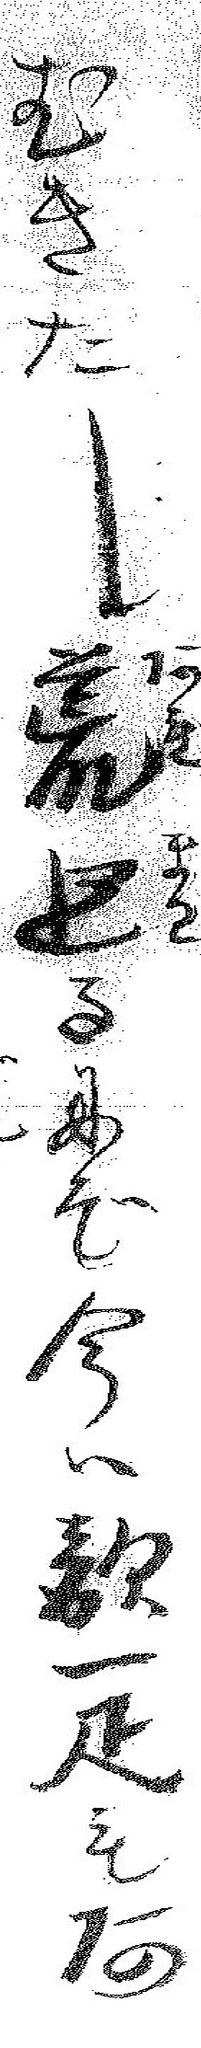むきたし荒廻るにぞ今は敵一疋もあ
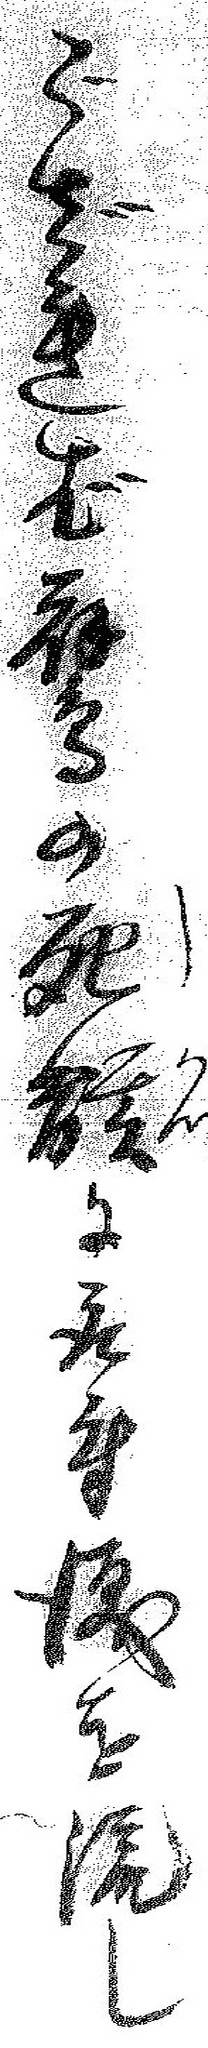らざれば鷹の死骸に取付涙を流し
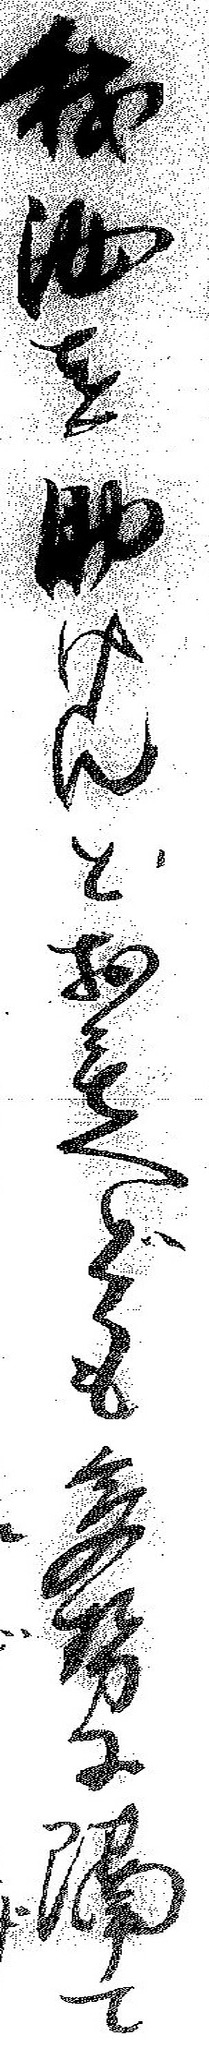我汝を助けんとおもへども多勢に隔て
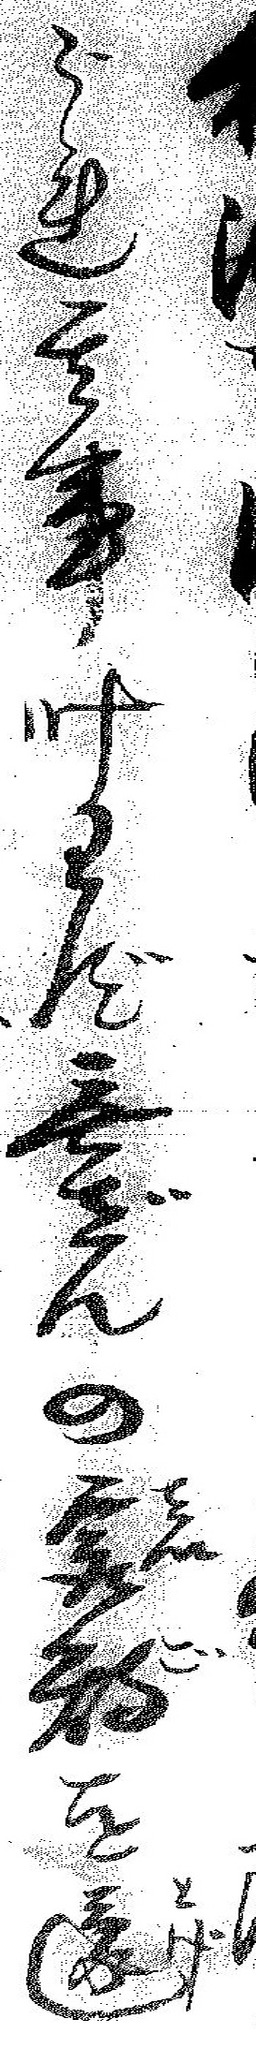られ其事叶わず無ざんの最期を遂
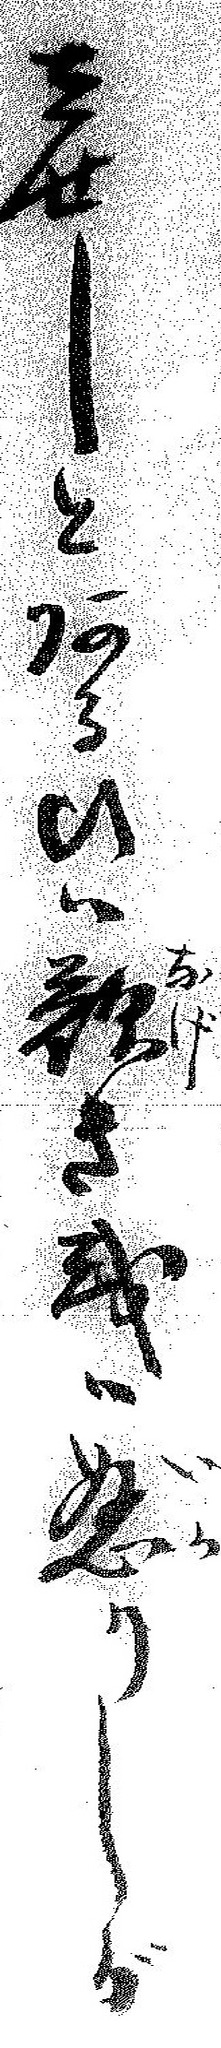させしとあるひは歎き或は怒りしが
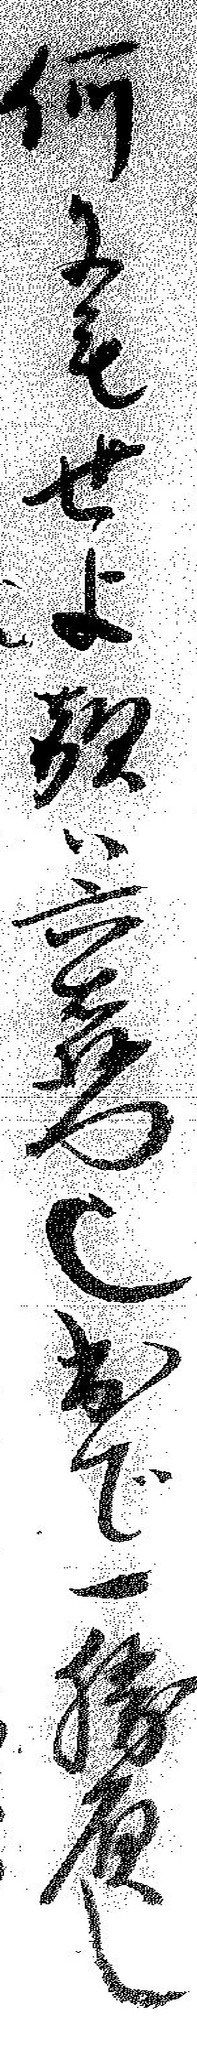何にもせよ敵は六右衛門也出で一勝負し
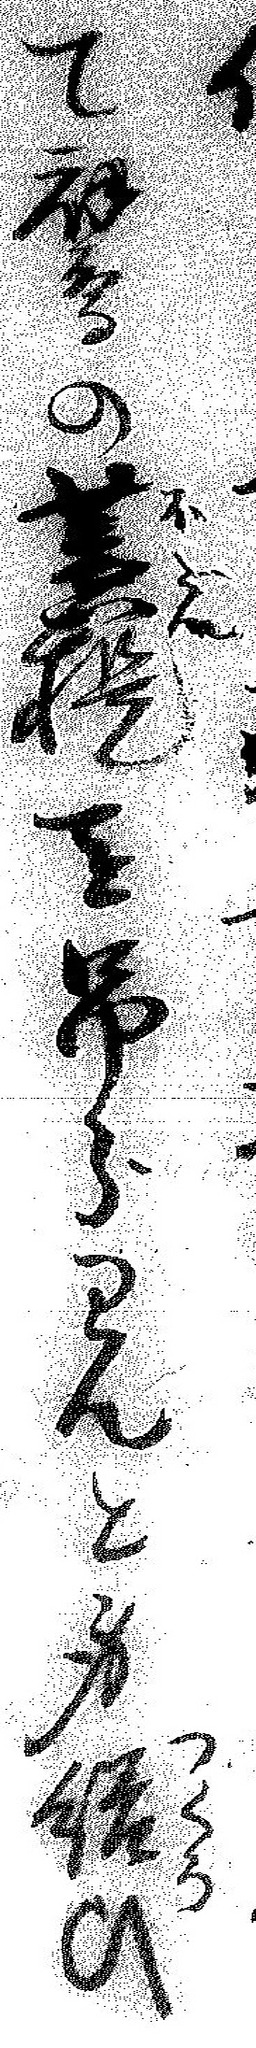て鷹の菩提を吊らわんと身繕ひ
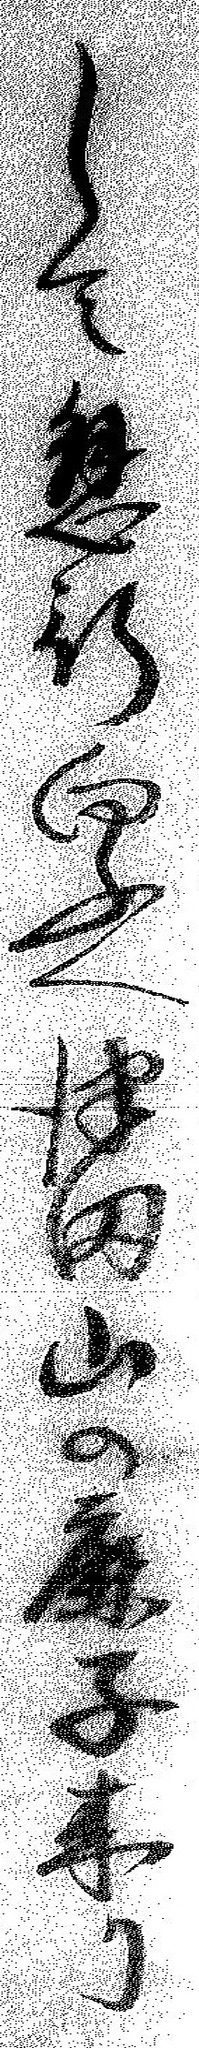して懸行向ふへ津田山の鹿子来り

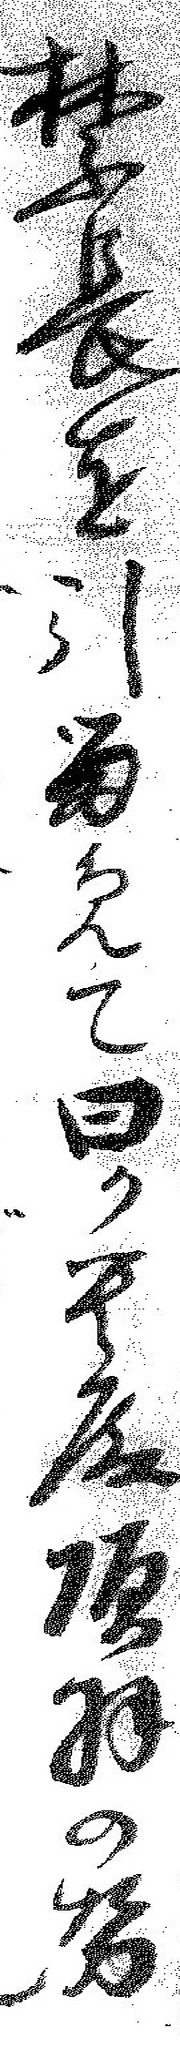禁長を引留めて曰く貴殿項羽勢
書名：近頃古狸珍説　礼義智信
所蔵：徳島県立図書館
